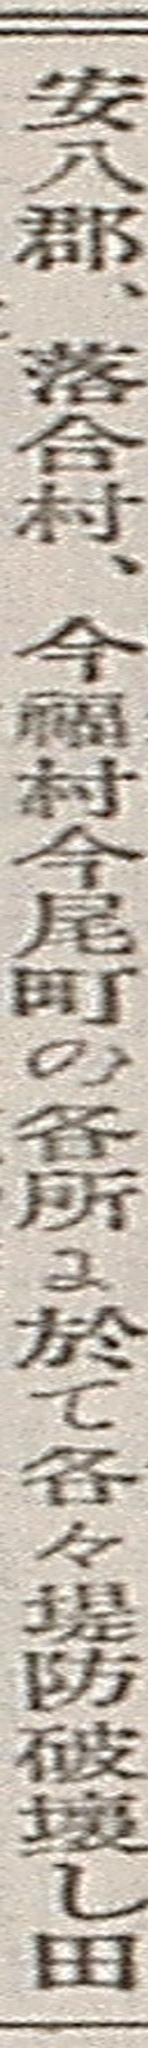安八郡、落合村、今福村今尾町の各所に於て各々堤防破壊し
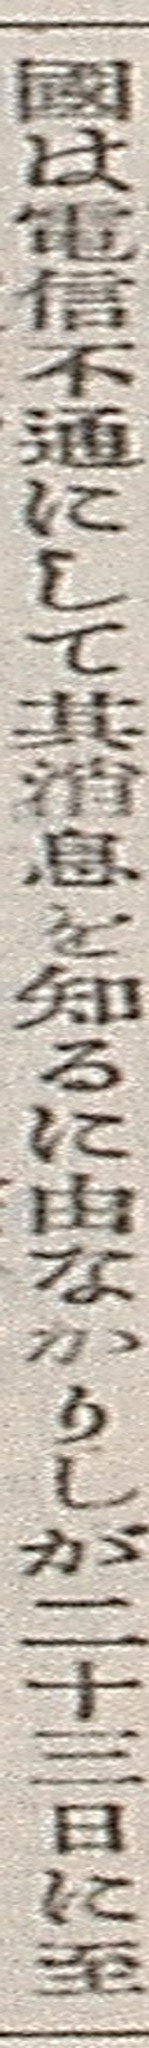国は電信不通にして其消息を知るに由なかりしが二十三日に至
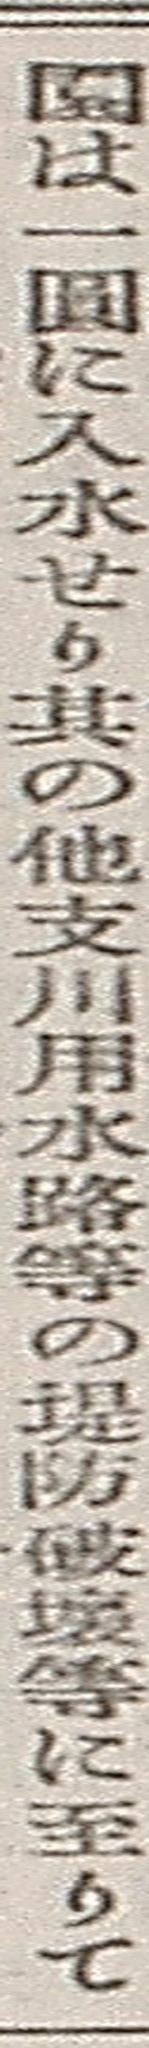田圃は一円に入水せり其の他支川用水路等の堤防破壊等に至りて
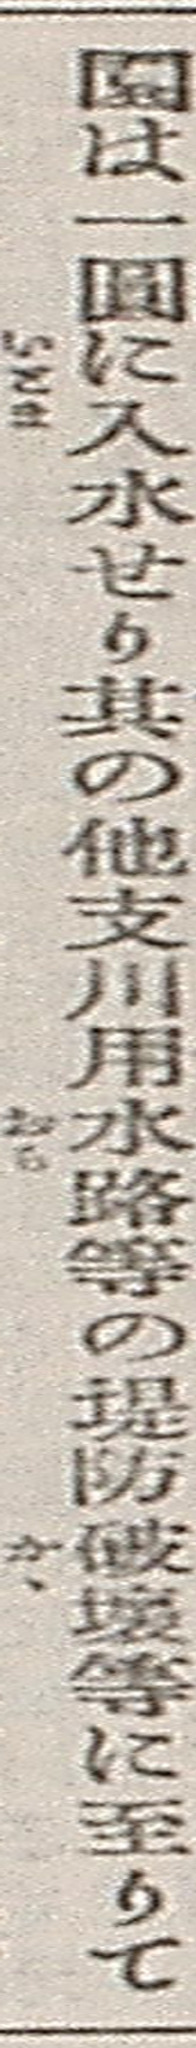田圃は一円に入水せり其の他支川用水路等の堤防破壊等に至りて
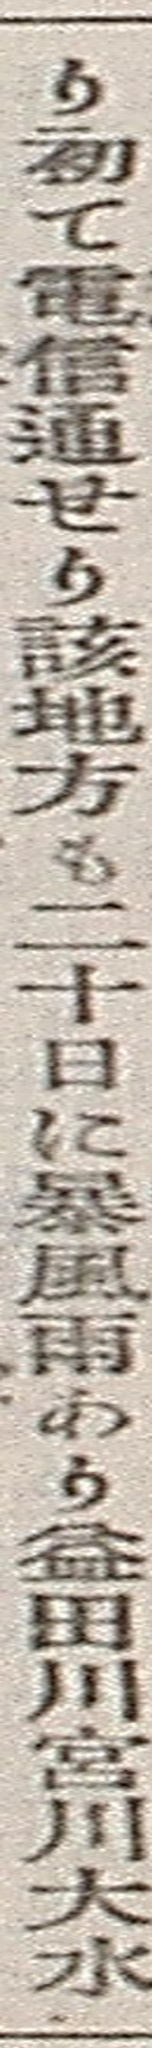り初て電信通せり該地方も二十日に暴風雨あり増田川宮川大水
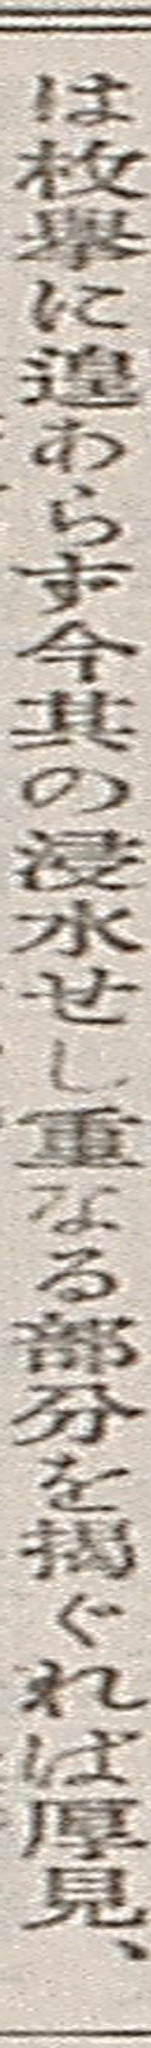は枚挙に遑あらず今其の浸水せし重なる部分を掲ぐれば厚見、
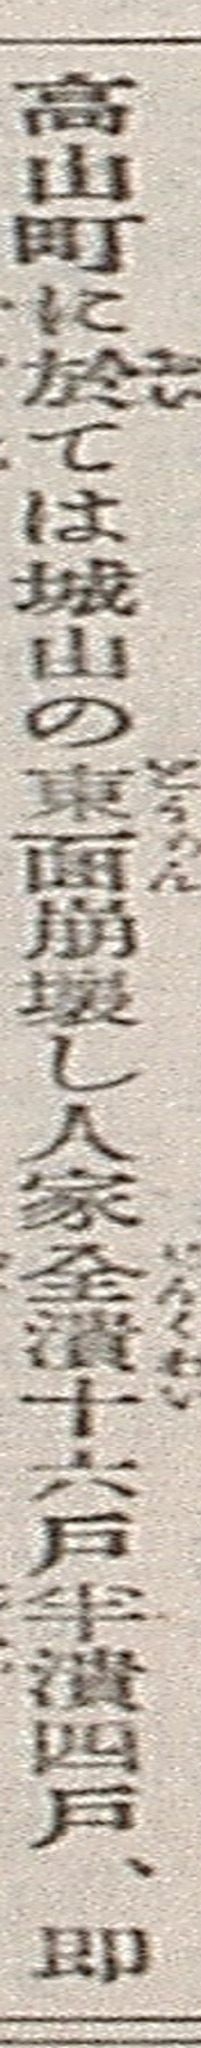高山町に於ては城山の東面崩壊し人家全潰十六戸半潰四戸、即
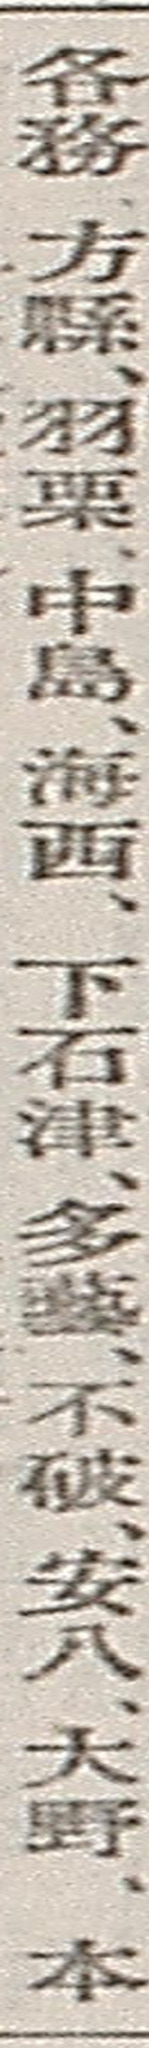各務、方縣、羽栗、中島、海西、下石津、多芸、不破、安八、大野、本
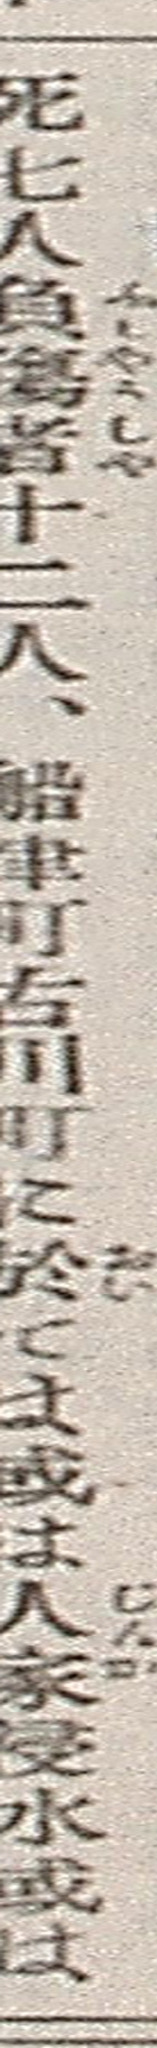死七人負傷者十二人、船津町古川町に於ては或は人家浸水或は
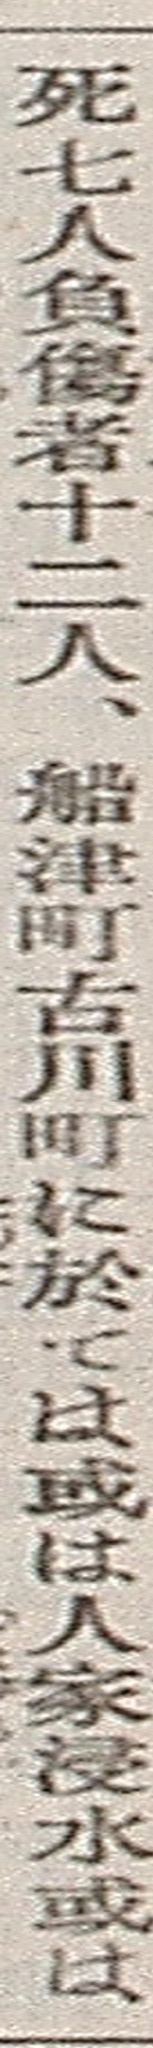死七人負傷者十二人、船津町古川町に於ては或は人家浸水或は
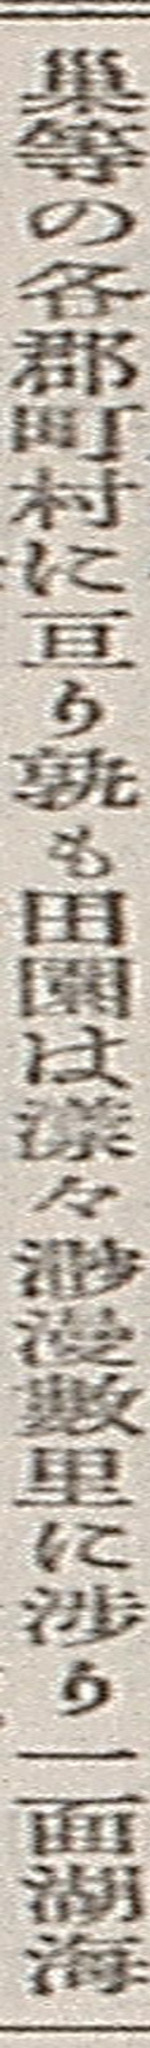巣等の各郡町村に亘り孰も田園は濛々渺万数里に渉り一面湖海
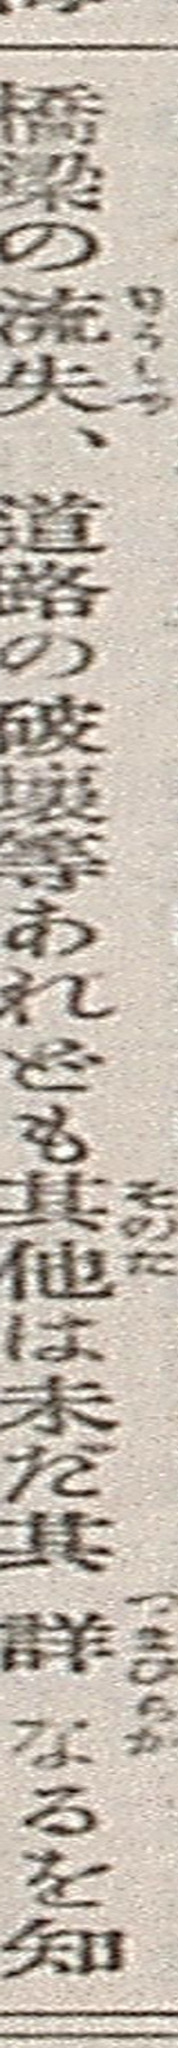橋梁の流失、道路の破壊等あれども其他は未だ其詳なるを知
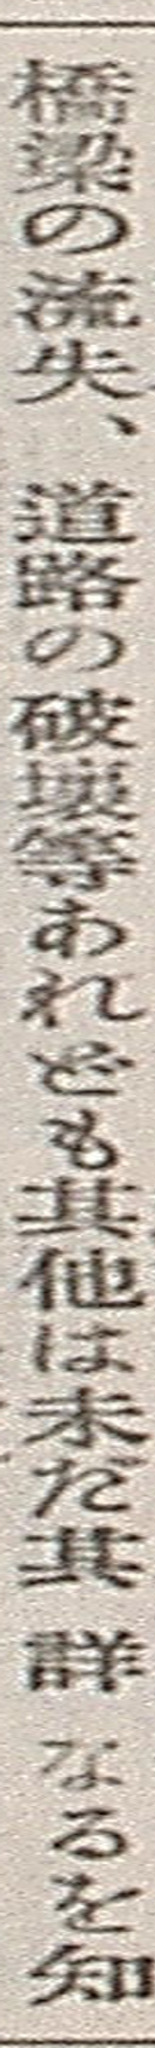橋梁の流失、道路の破壊等あれども其他は未だ其詳なるを知
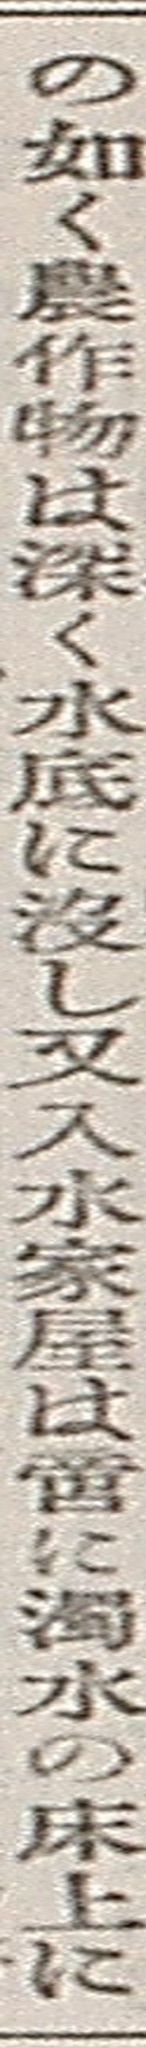の如く農作物は深く水底に没し又入水家屋は当に濁水の床上に
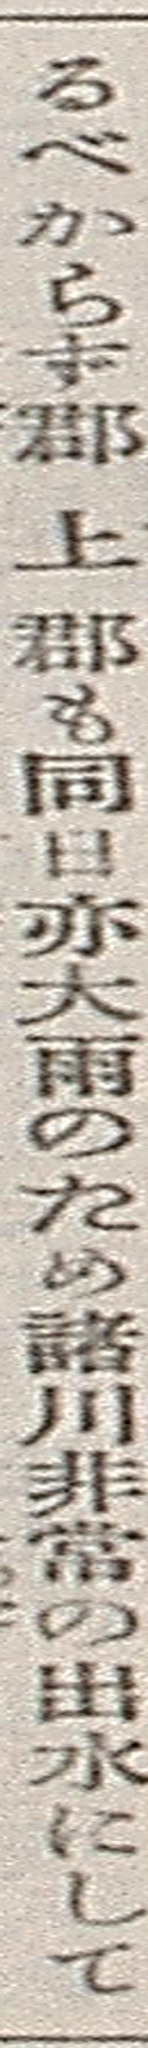るべからず郡上郡も亦大雨のため諸川非常の出水にして
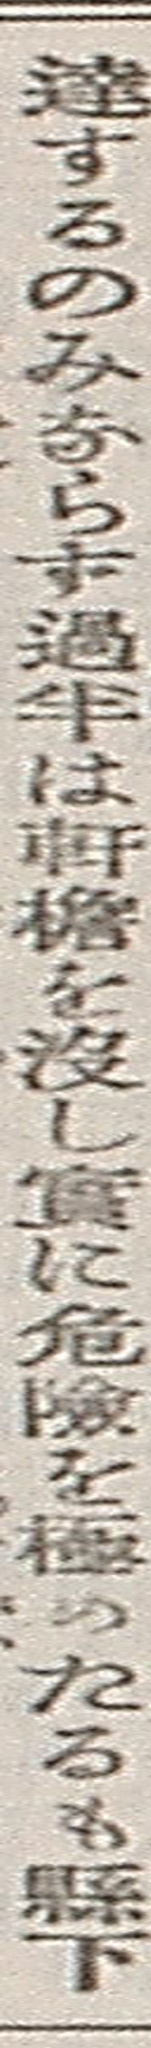達するのみならず過半は軒擔を没し実に危険を極めたるも県下
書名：風俗畫報臨時増刊第百二十六號　洪水被害録（中）
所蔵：東京大学地震研究所図書室 Earthquake Research Institute Library, The University of Tokyo, JAPAN
